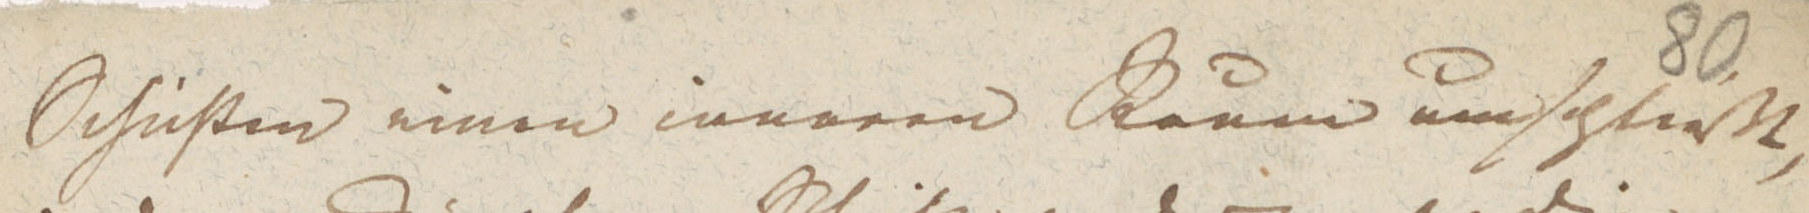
Schichten einen inneren Raum umschliesst,
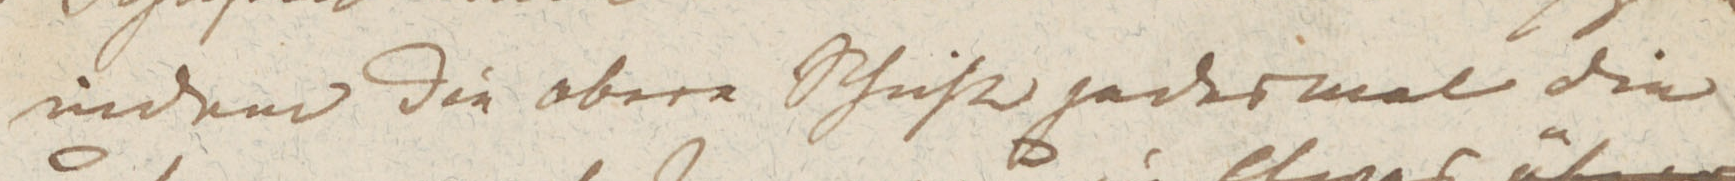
indem die obere Schicht jedesmal die
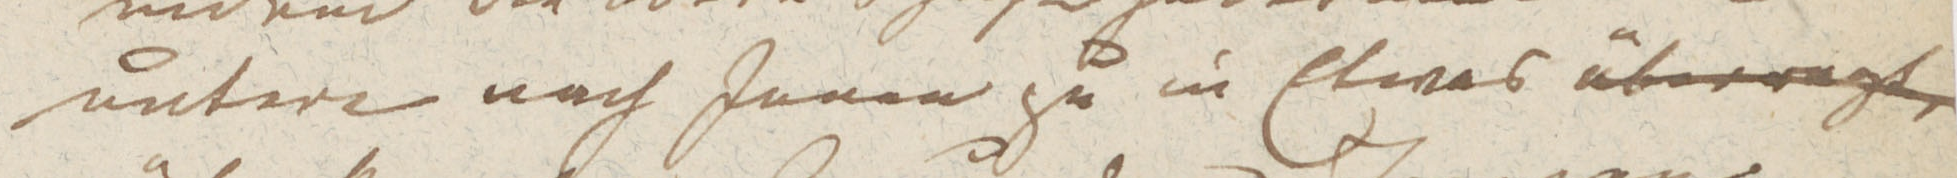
untere nach Innen zu in Etwas überragt,
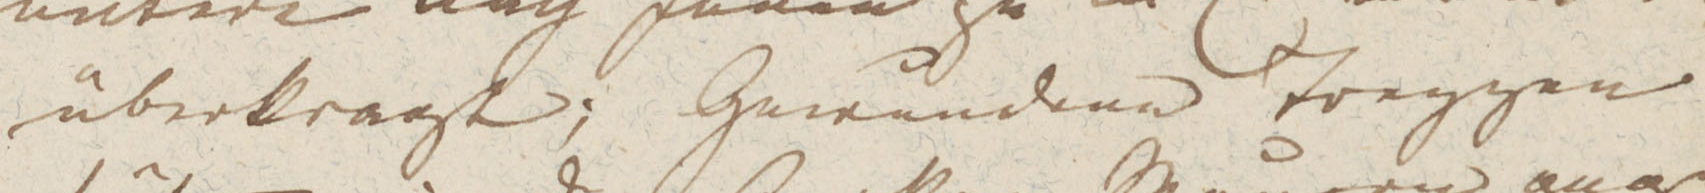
überkragt; Gewundene Treppen
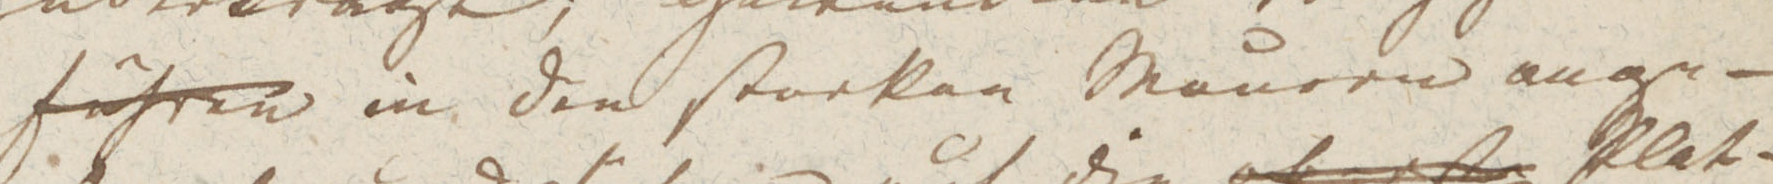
führen in den starken Mauern ange-
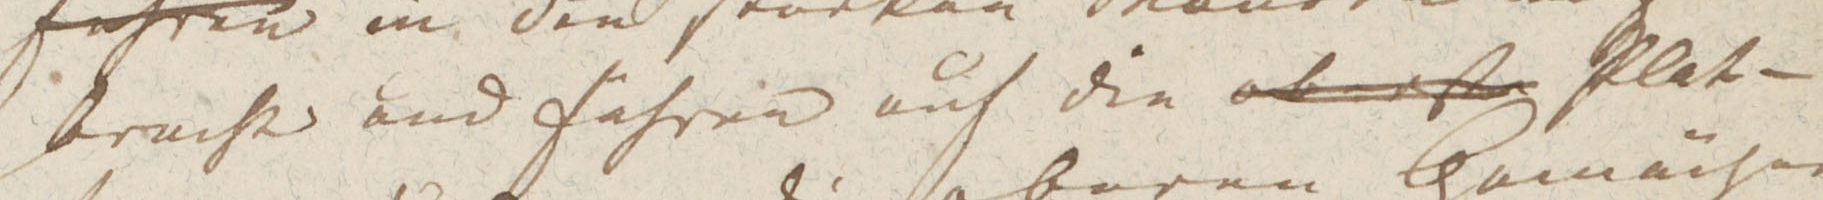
bracht und führen auf die oberste Plat-
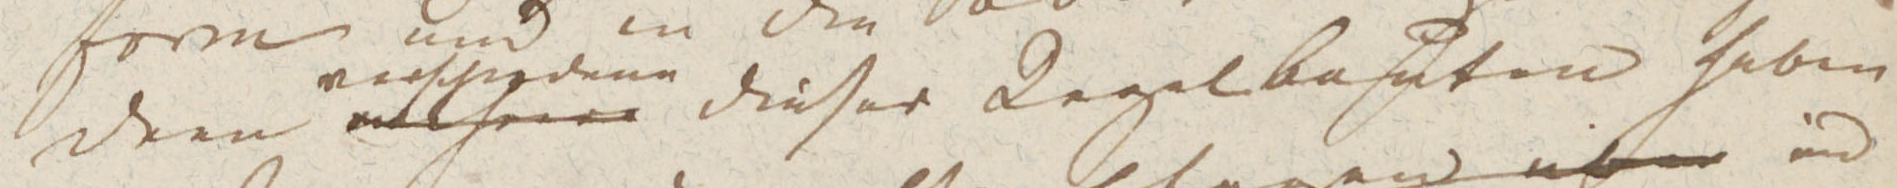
denn mehrere verschiedene dieser Kegelbauten haben
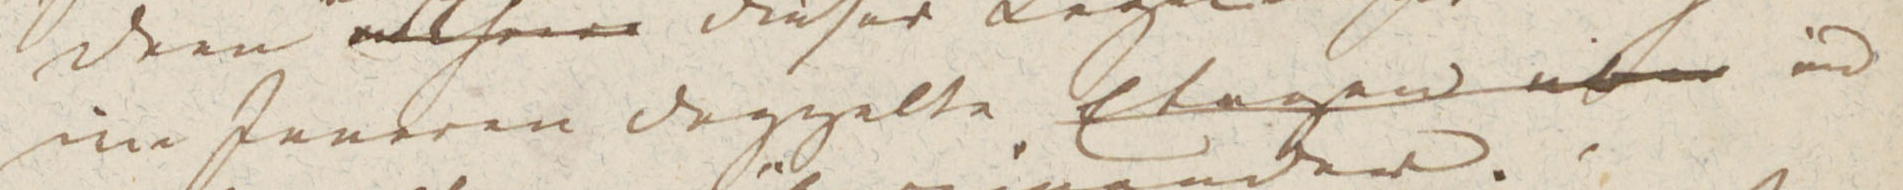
im Inneren doppelte Etagen über und
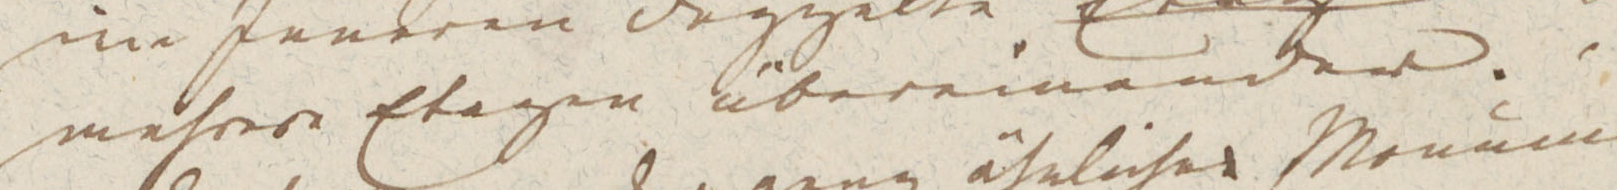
mehrere Etagen übereinander.
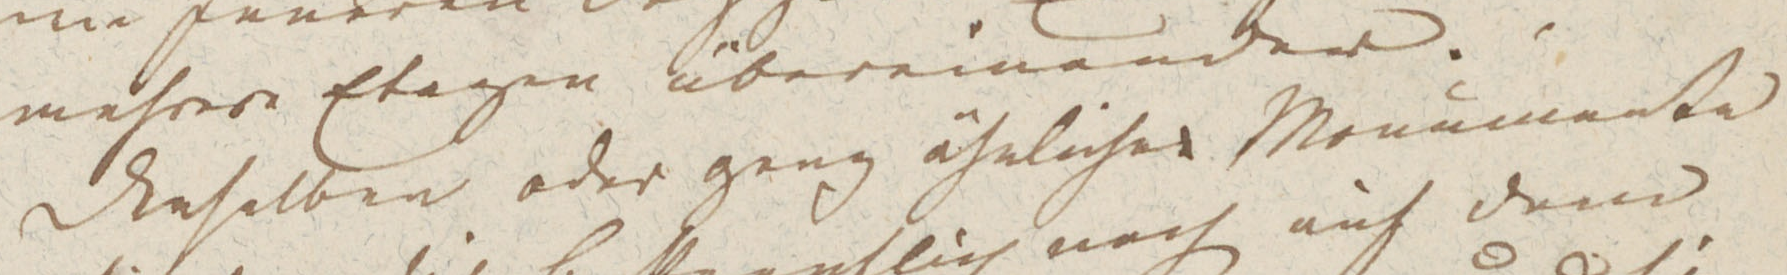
Dieselben oder ganz ähnliche Monumente
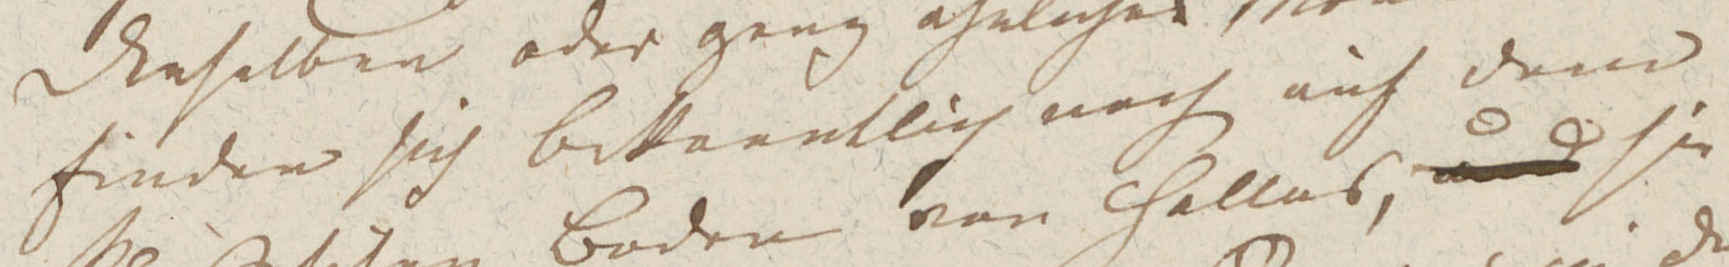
finden sich bekanntlich noch auf dem
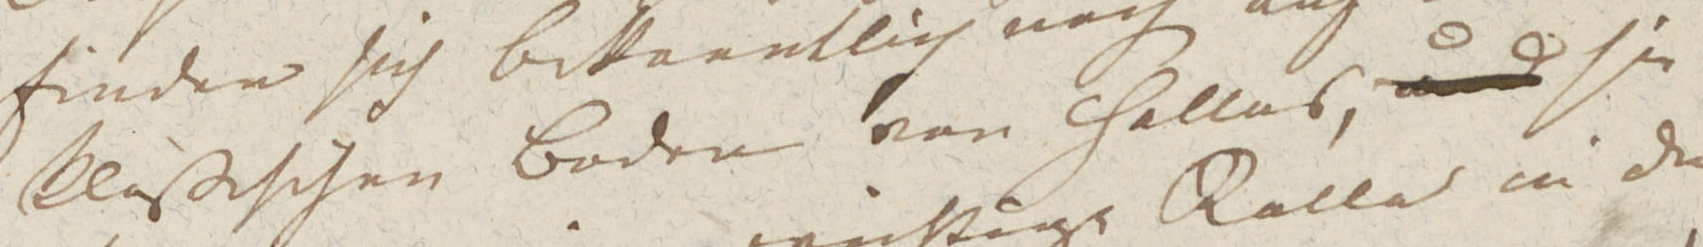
klassischen Boden von Hellas, und sie
